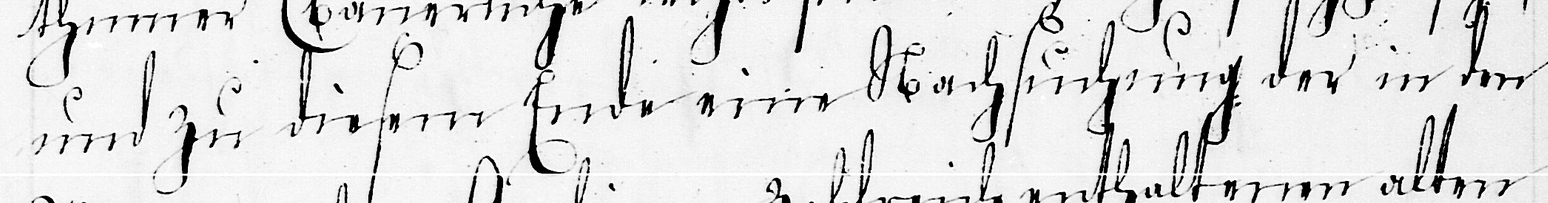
und zu diesem Ende eine Nachsuchung der in den
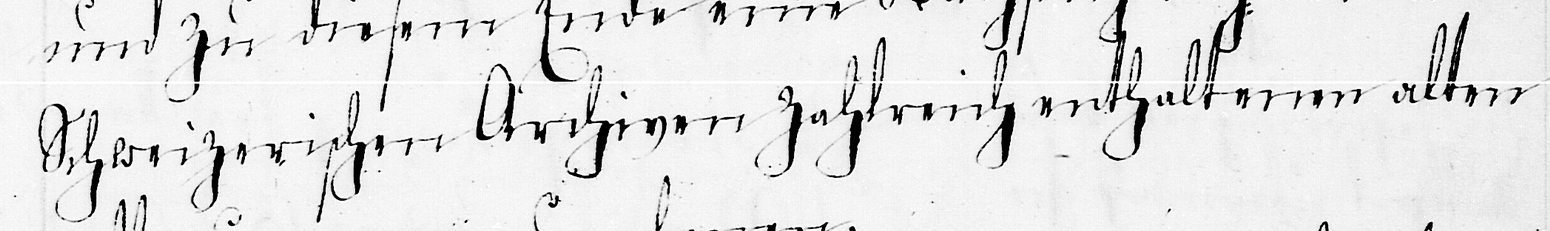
Schweizerischen Archiven zahlreich enthaltenen alten
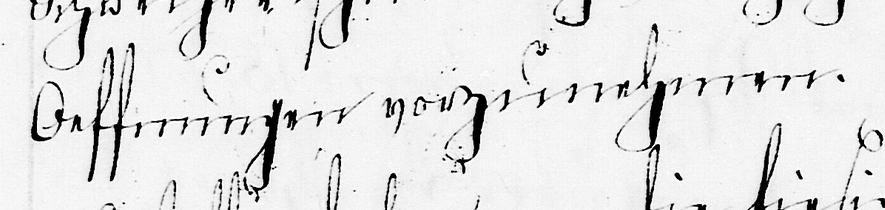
Oeffnungen vorzunehmen.
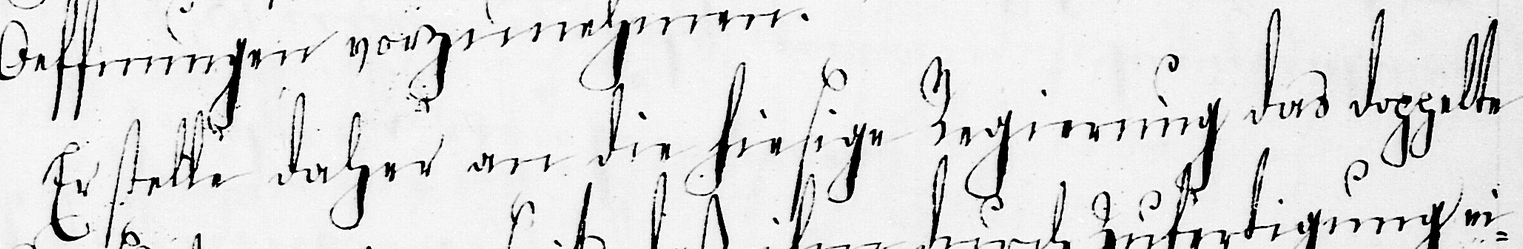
stelle daher an die hiesige Regierung das doppel¬
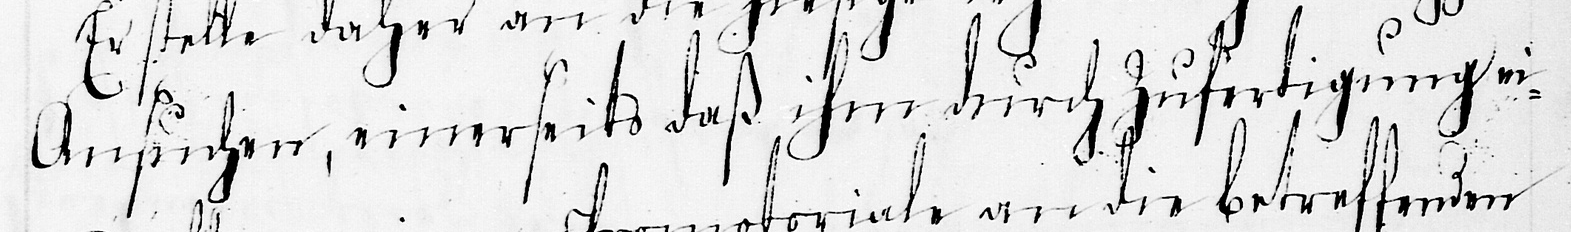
Ansuchen, einerseits daß ihm durch Zufertigung ei¬
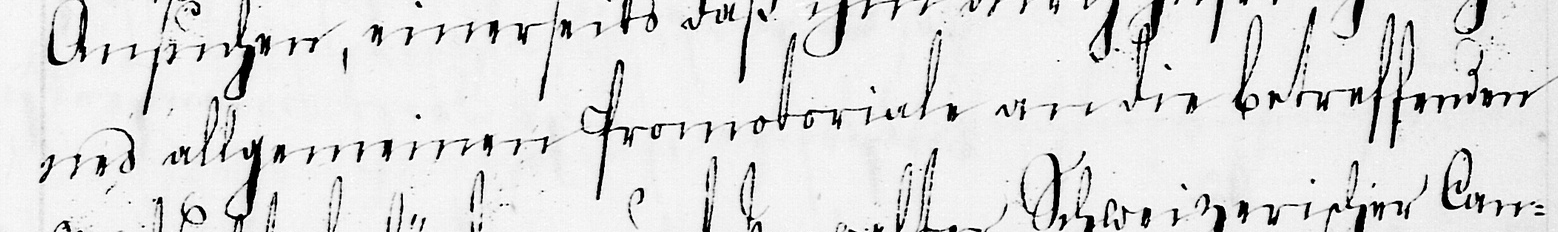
nes allgemeinen Promotoriale an die betreffenden
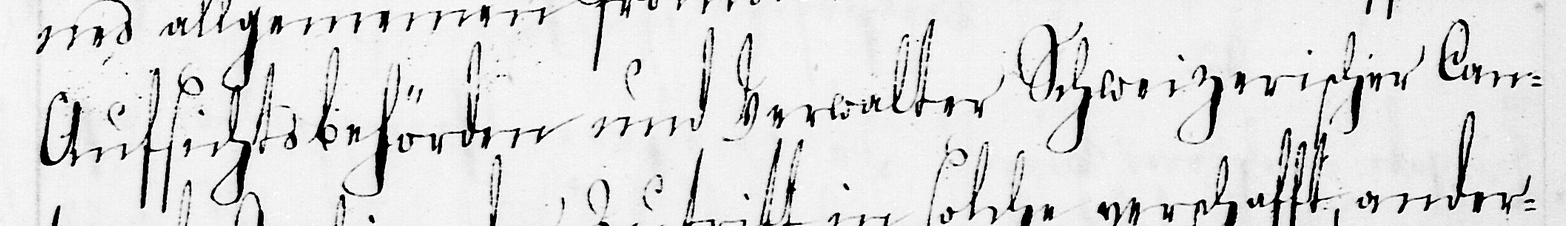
Aufsichtsbehörden und Verwalter Schweizerischer Can¬
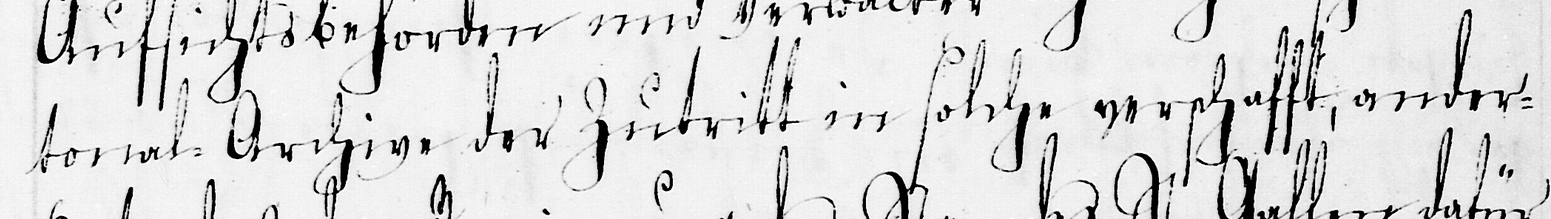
tonal-Archive der Zutritt in solche verschafft, ander¬
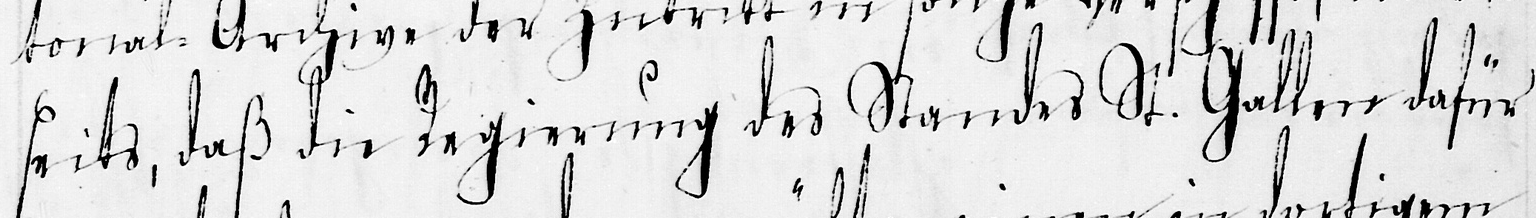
seits, daß die Regierung des Standes St. Gallen dafür
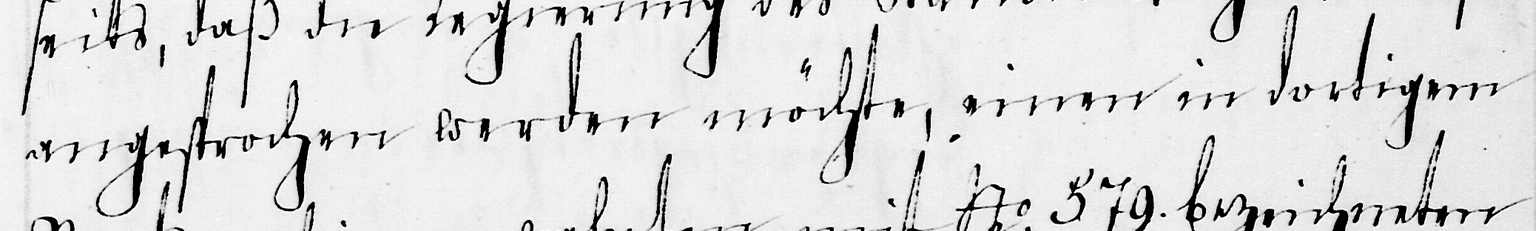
angesprochen werden möchte, einen in dortigem
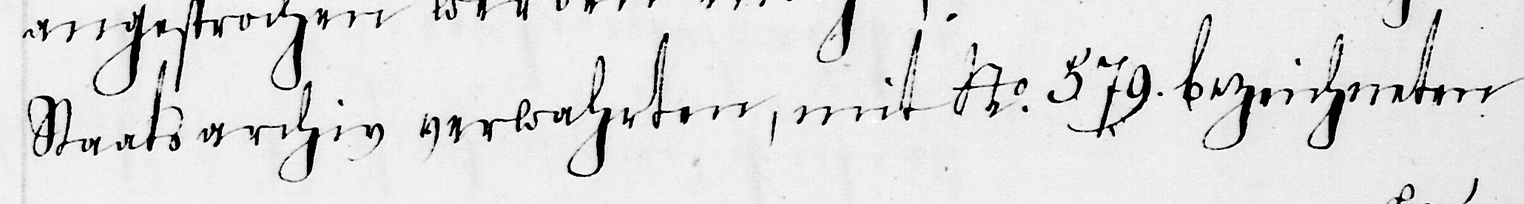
Staatsarchiv verwahrten, mit No. 579. bezeichneten
